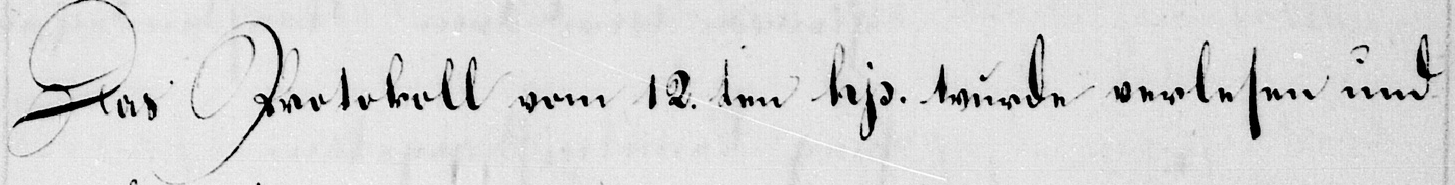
Das Protokoll vom 12.ten hjs. wurde verlesen und
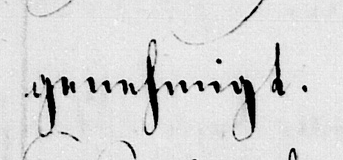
genehmigt.
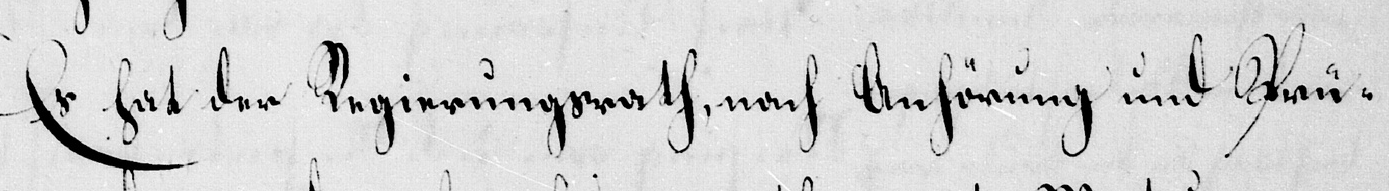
Es hat der Regierungsrath, nach Anhörung und Prü¬
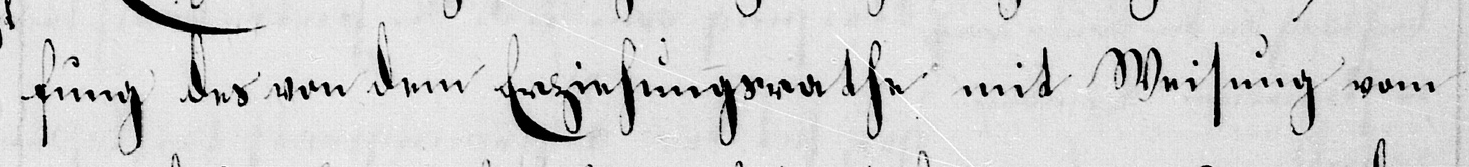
fung des von dem Erziehungsrathe mit Weisung vom
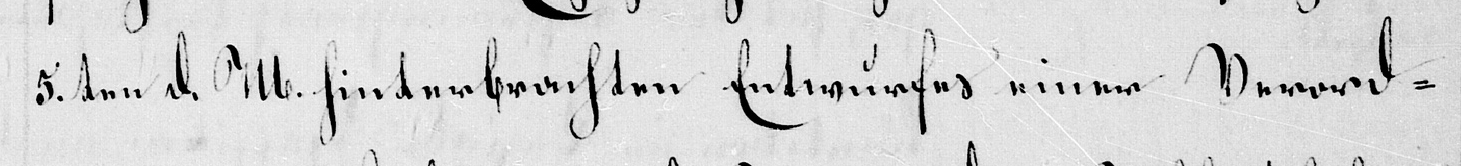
5.ten d. M. hinterbrachten Entwurfes einer Verord¬
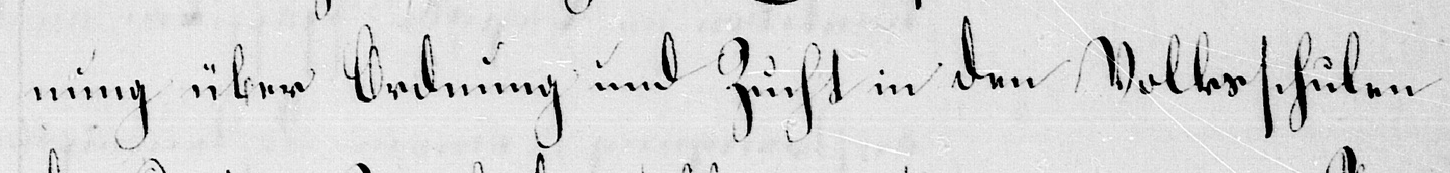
nung über Ordnung und Zucht in den Volksschulen
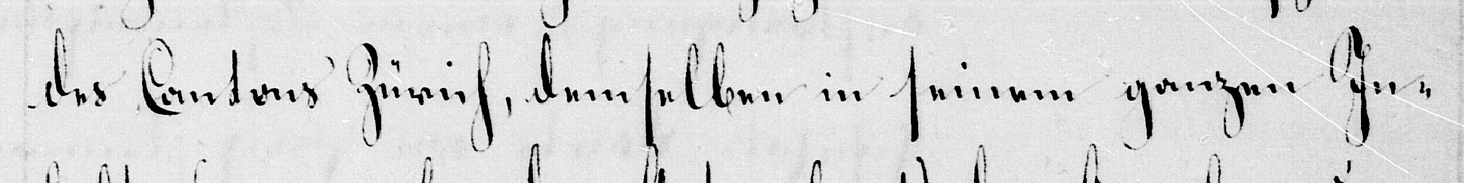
des Cantons Zürich, demselben in seinem ganzen In¬
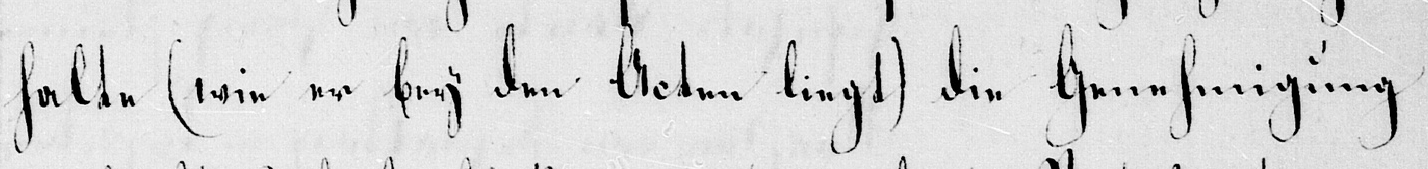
halte (wie er bey den Acten liegt) die Genehmigung
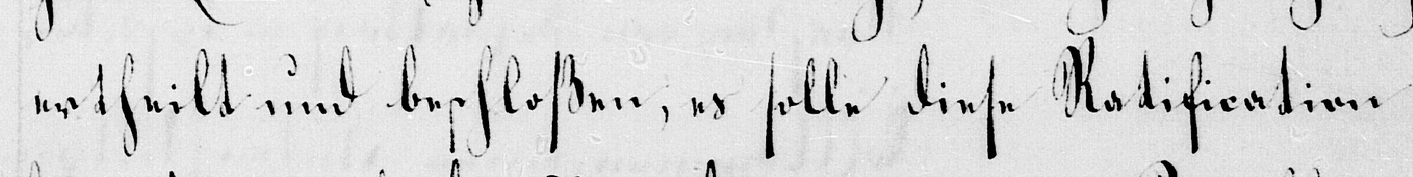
ertheilt und beschloßen, es solle diese Ratification
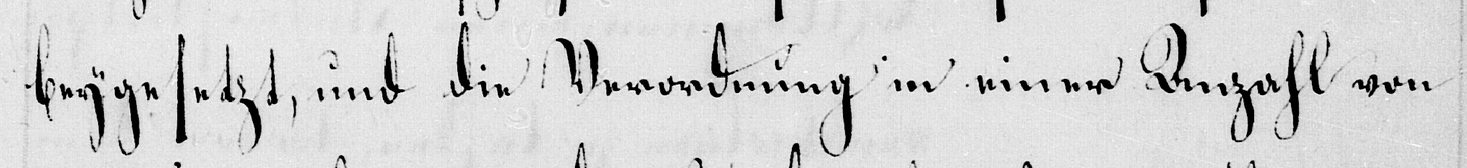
beygesetzt, und die Verordnung in einer Anzahl von
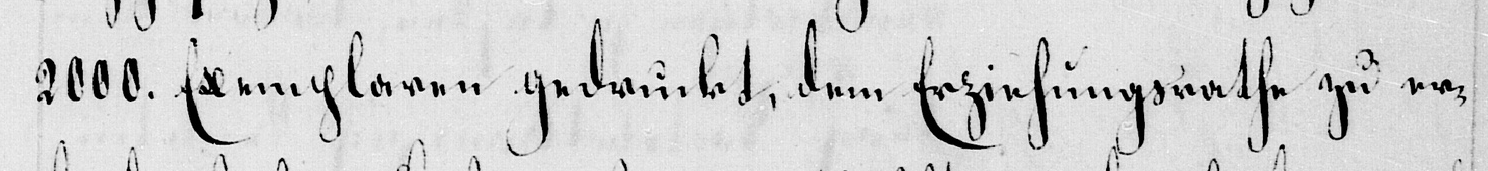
2000. Exemplaren gedruckt, dem Erziehungsrathe zu er¬
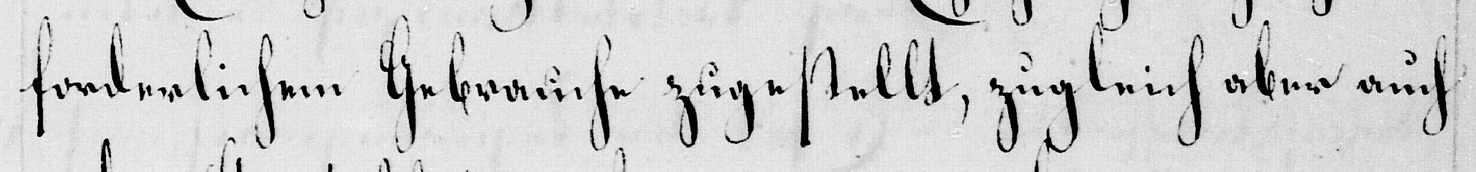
forderlichem Gebrauche zugestellt, zugleich aber auch
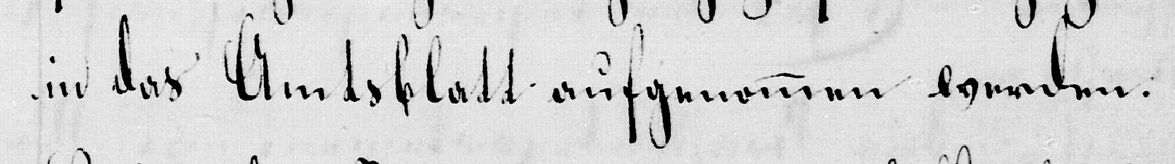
in das Amtsblatt aufgenommen werden.
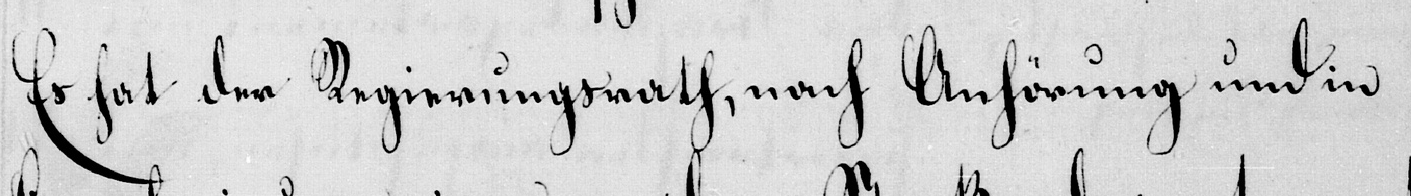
Es hat der Regierungsrath, nach Anhörung und in
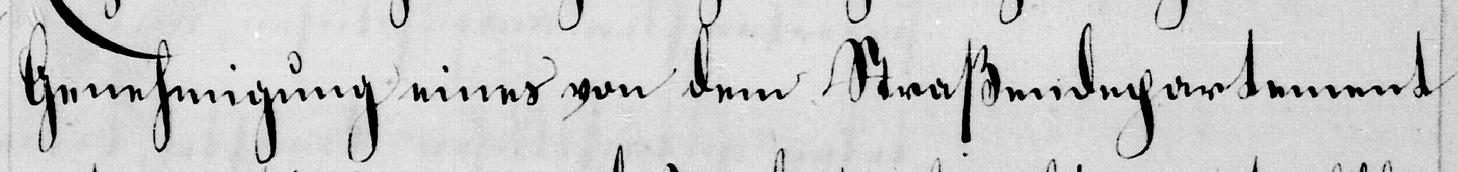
Genehmigung einer von dem Straßendepartement
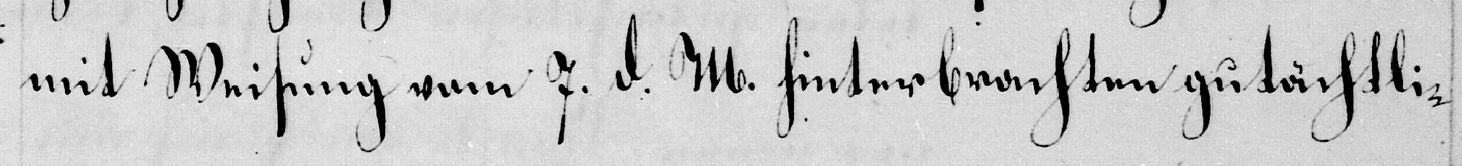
mit Weisung vom 7. d. M. hinterbrachten gutächtli-
